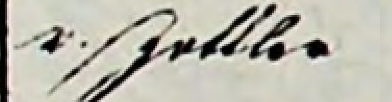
v. Zottler
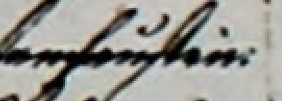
Ramsaustein
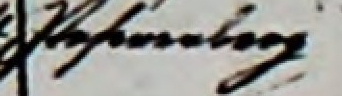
Posererberg
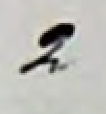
2
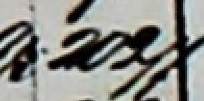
202/f
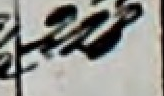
218
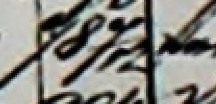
787,2
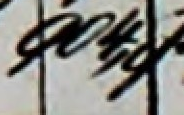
904,9
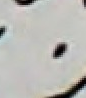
,
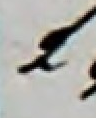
2
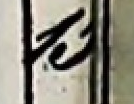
15
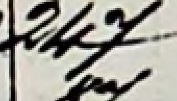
247
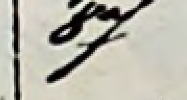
87
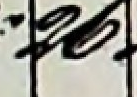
26
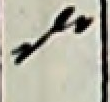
do
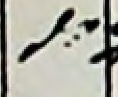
do
